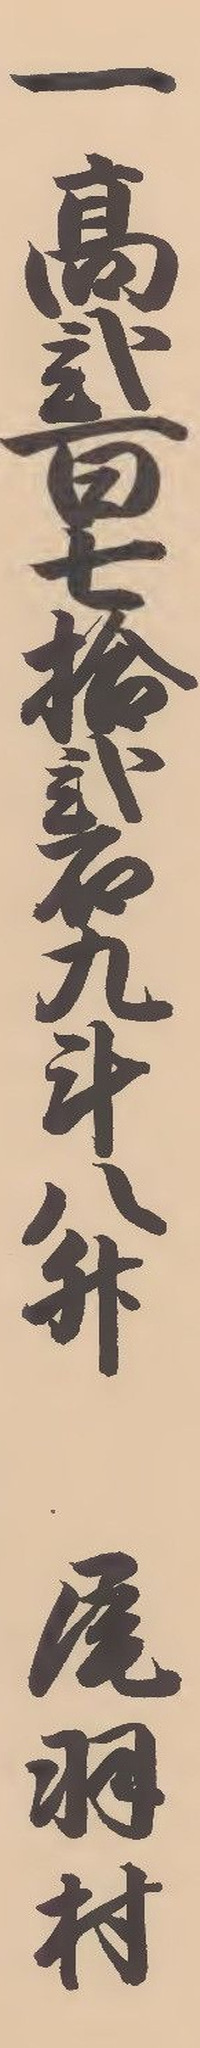一高弐百七拾弐石九斗八升尾羽村
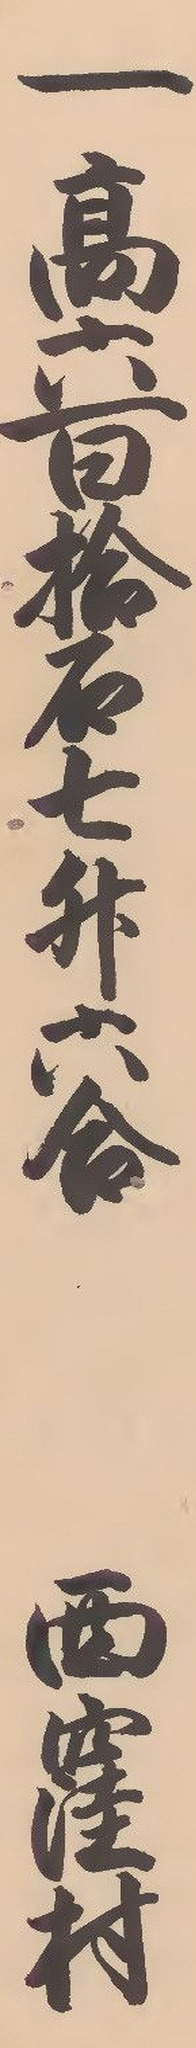一高六百拾石七升六合西窪村

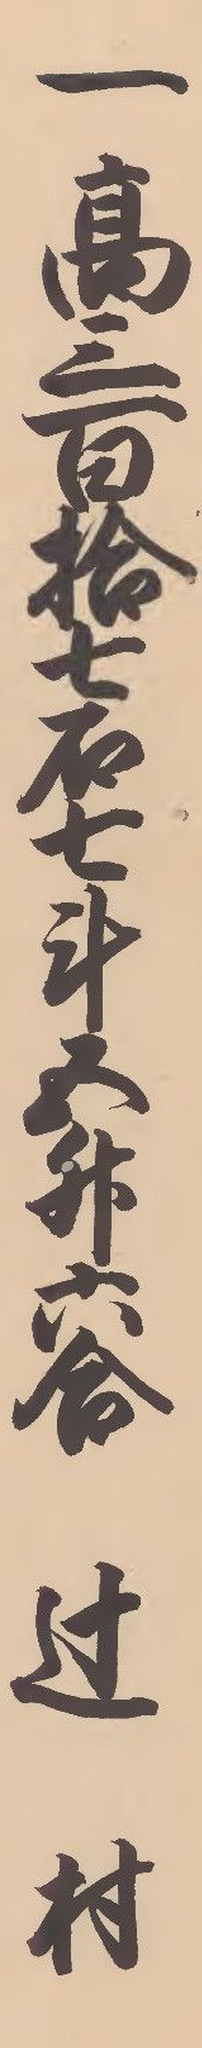一高三百拾七石七斗五升六合辻村
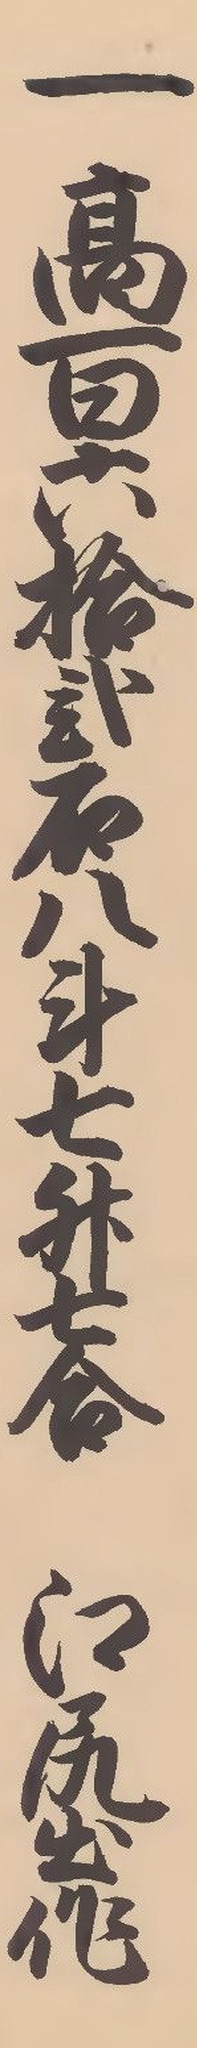一高百六拾弐石八斗七升七合江尻出作
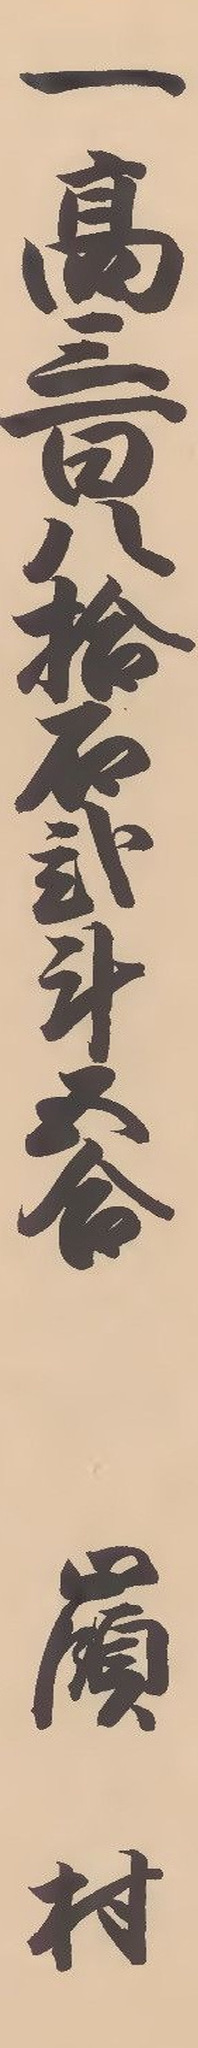一高三百八拾石弐斗五合嶺村
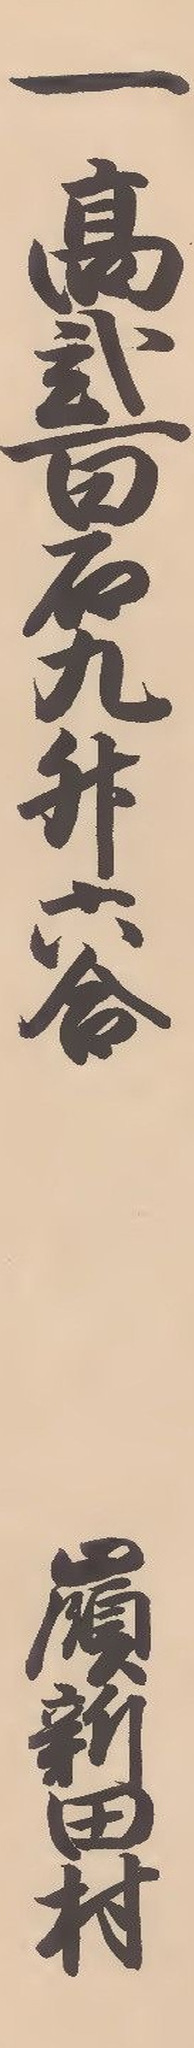一高弐百石九升六合嶺新田村
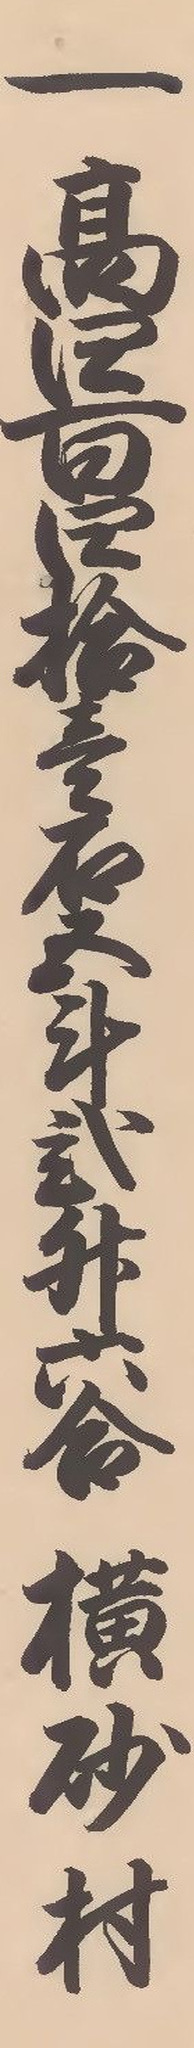一高四百四拾壱石五斗弐升六合横砂村
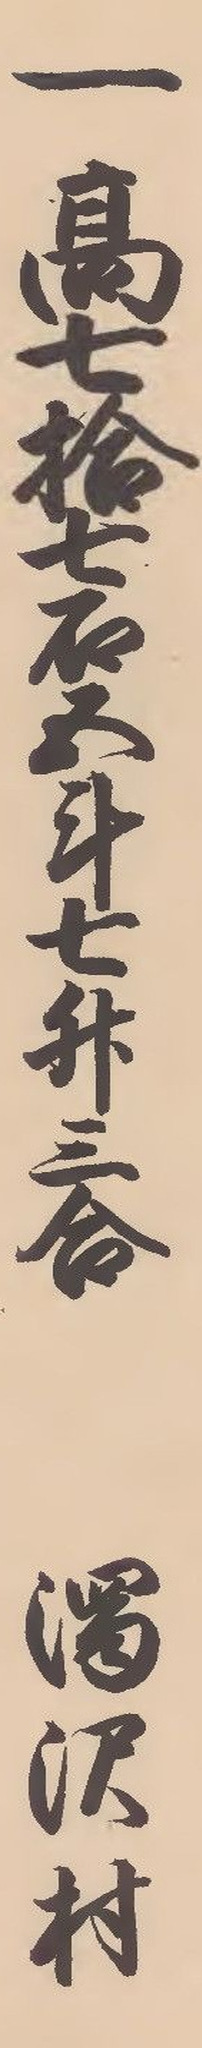一高七拾七石五斗七升三合濁沢村
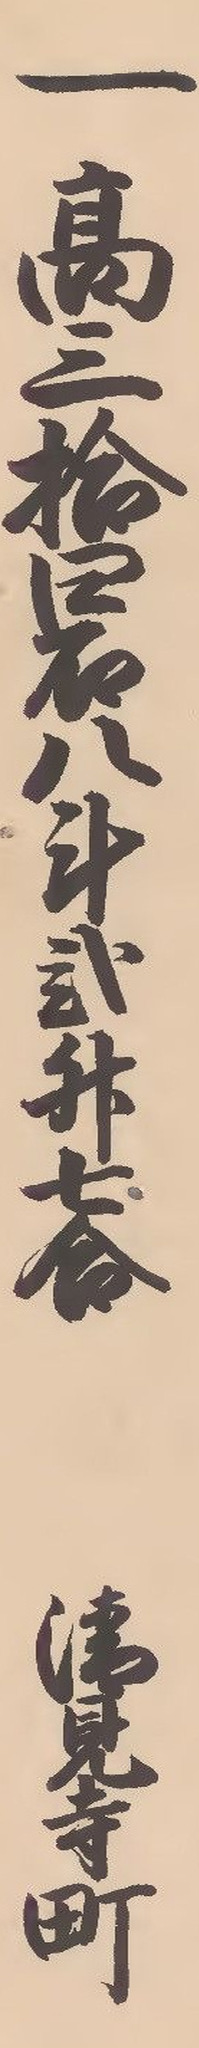一高三拾四石八斗弐升七合清見寺町

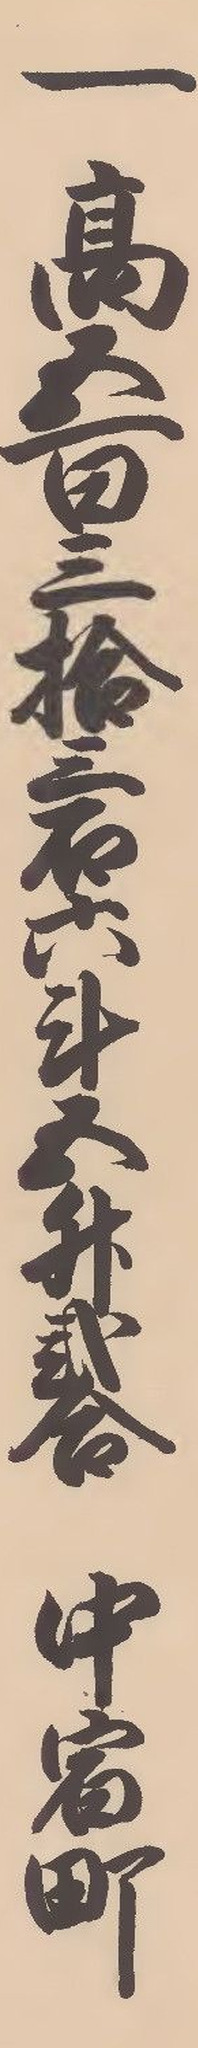一高五百三拾三石六斗五升弐合中宿町
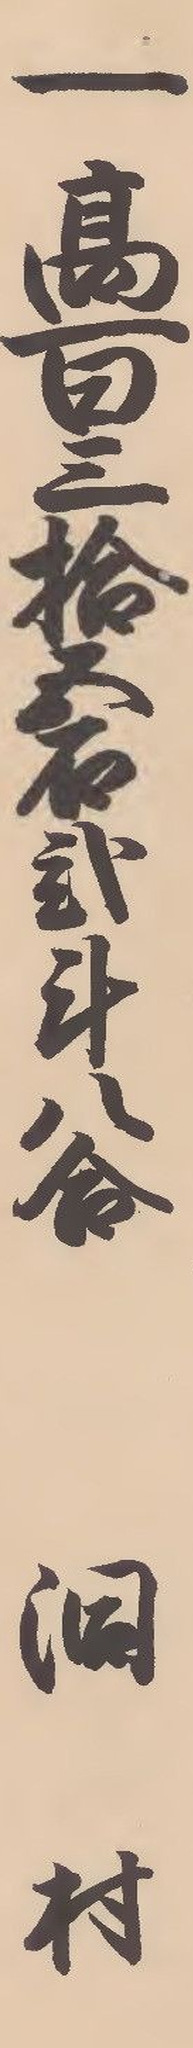一高百三拾五石弐斗八合洞村
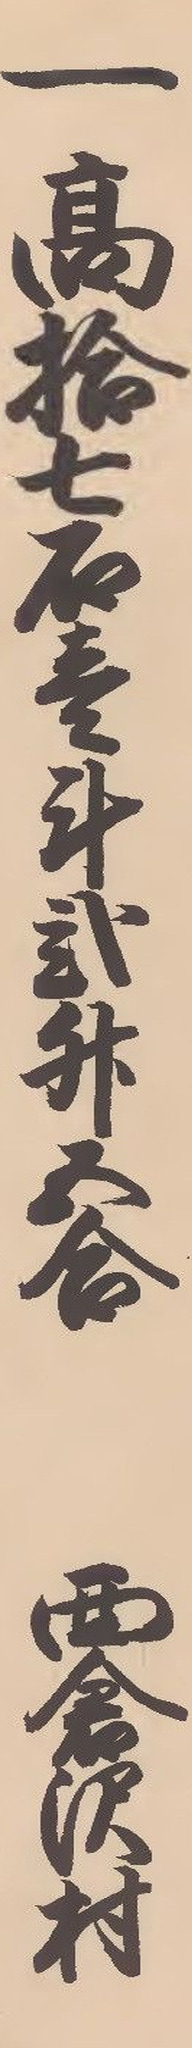一高拾七石壱斗弐升五合西倉沢村
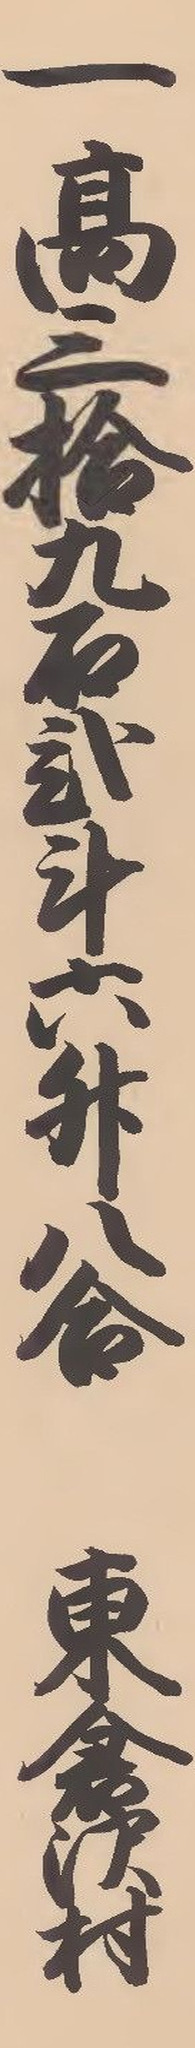一高三拾九石弐斗六升八合東倉沢村
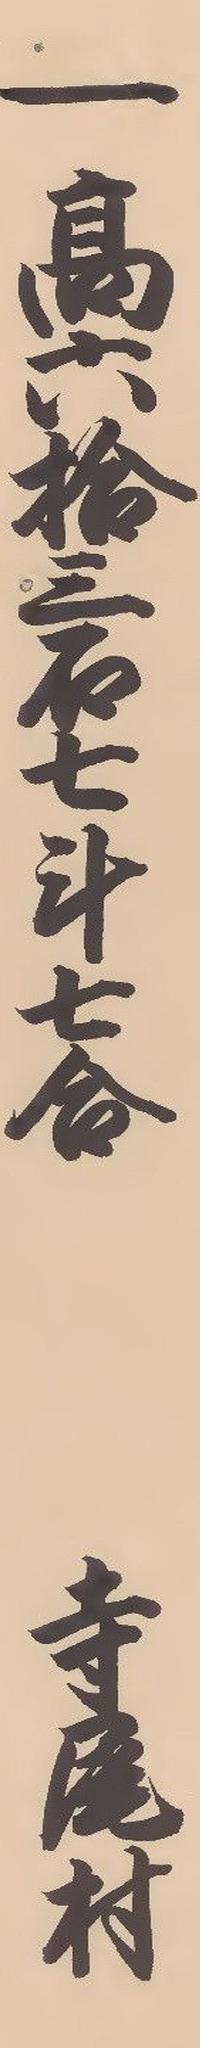一高六拾三石七斗七合寺尾村
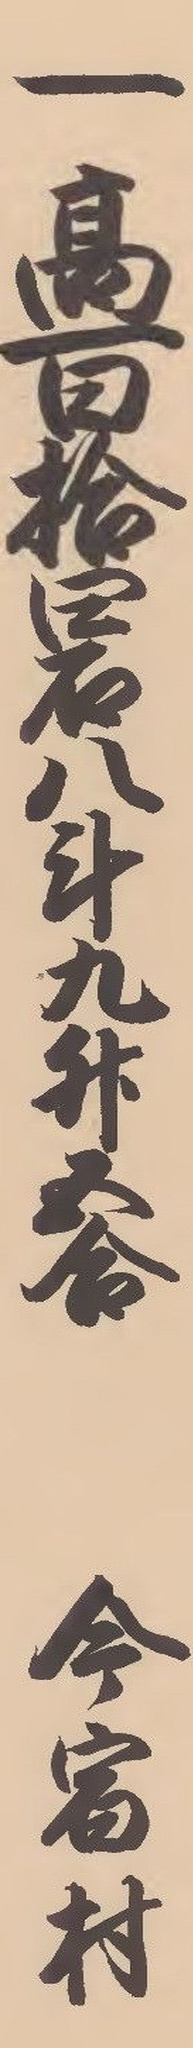一高百拾四石八斗九升五合今宿村
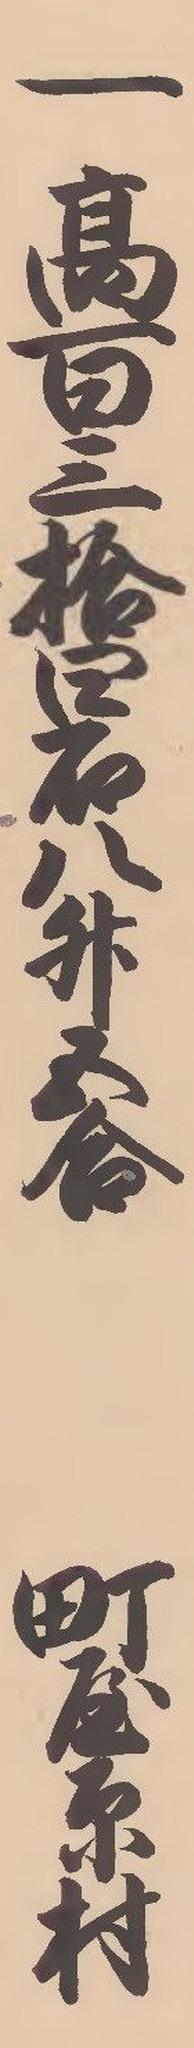一高百三拾四石八升五合町屋原村
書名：駿河国郷帳
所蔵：国立公文書館 National Archives of Japan
